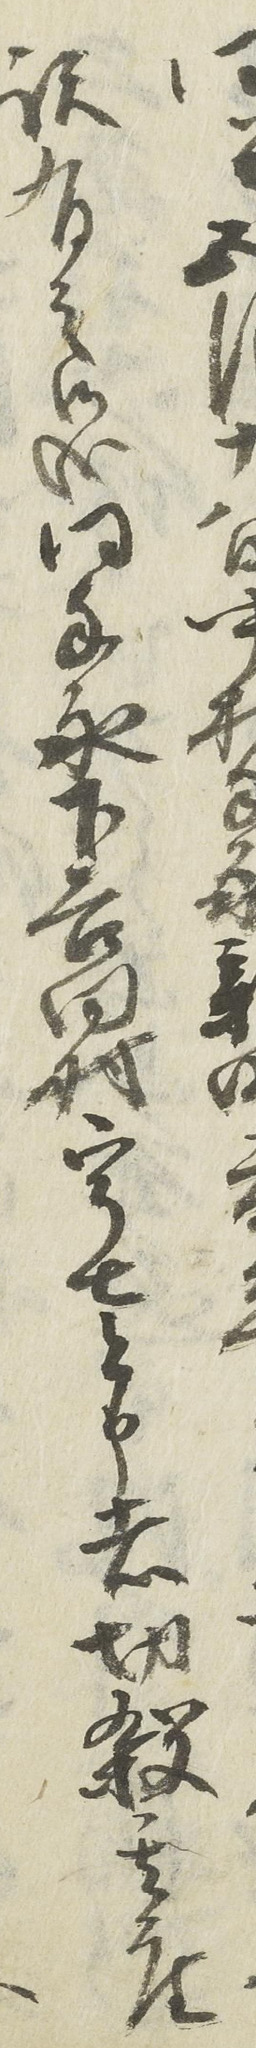訳有之候哉同手永下吉田村宇七と申者切殺其座

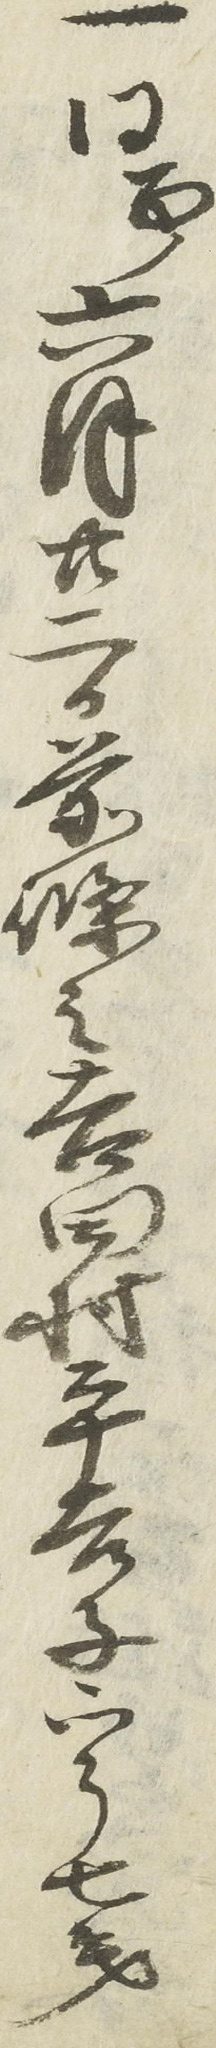一同酉ノ六月廿二日前条之吉田村平吉子宇七義
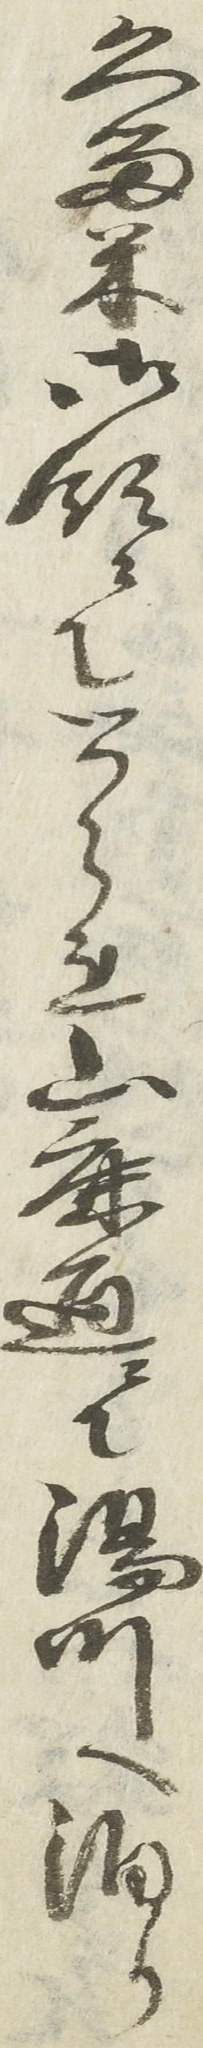久留米御領ニて止られ山鹿通ニて湯川へ泊り
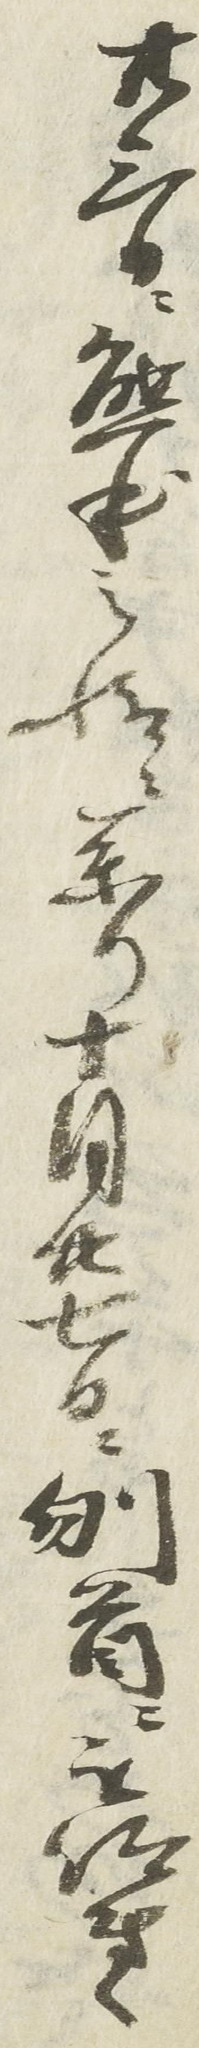廿三日ニ熊本之様ニ参り十月廿七日ニ刎首ニ被仰付候
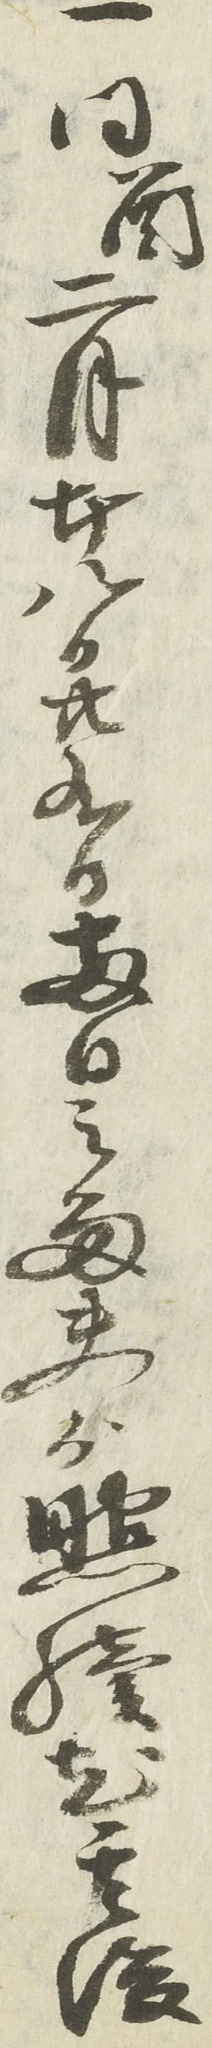一同酉二月廿八日廿九日両日の雨夫ゟ照続尤其後
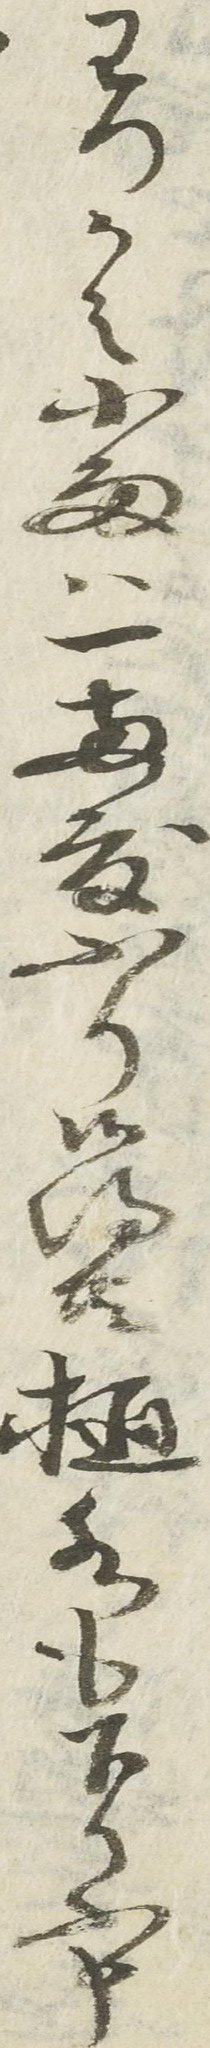わつか之小雨は一両度ふり候得共樋水も下り不申
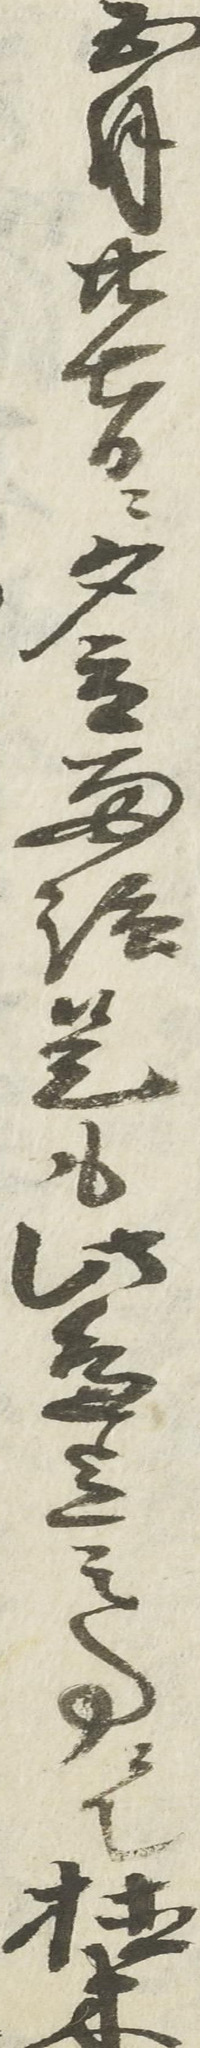五月廿七日ニ夕立雨強是も此辺迄之事ニて植木
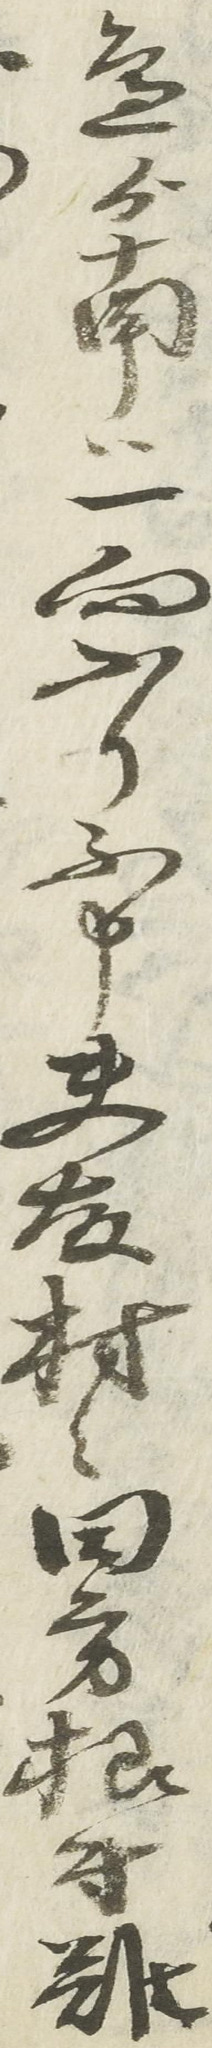辺ゟ南は一向ふり不申夫故村〻田方根付難
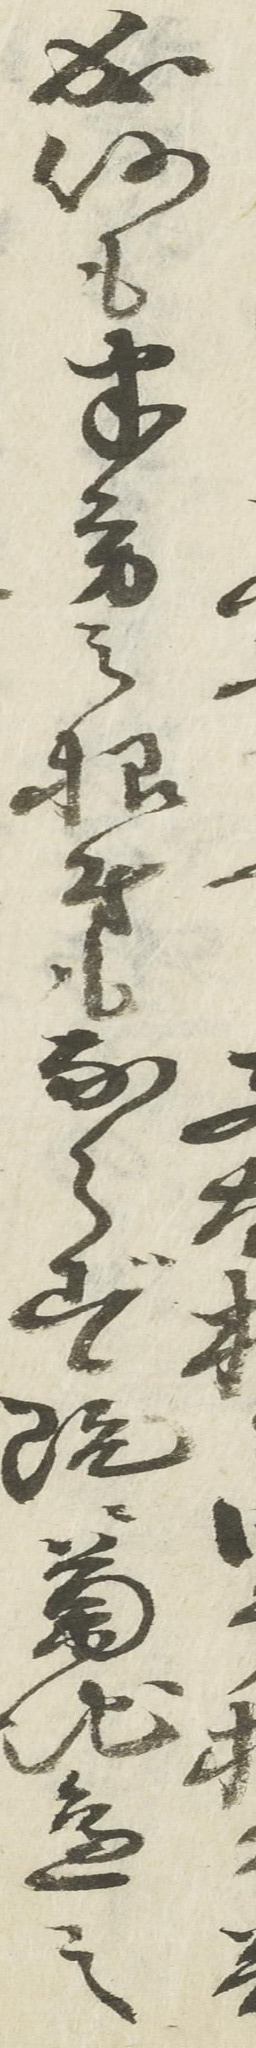成何も半方之根付もならず既ニ菊池辺之
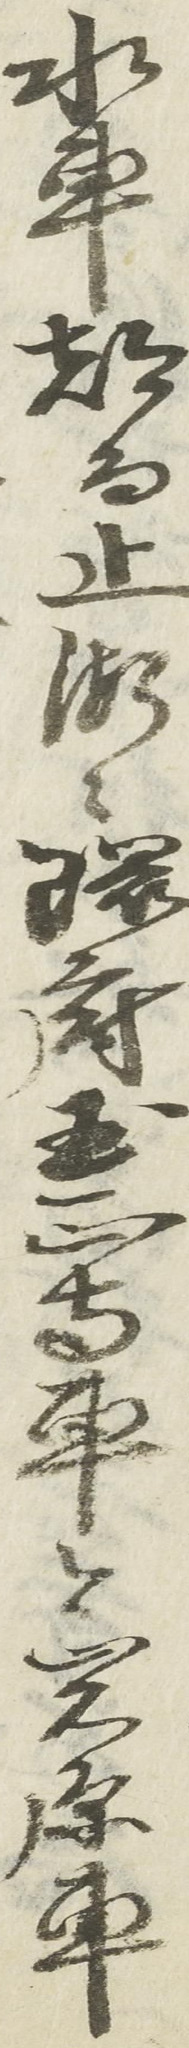水車都而止漸〻隈府玉正守車と岩原車
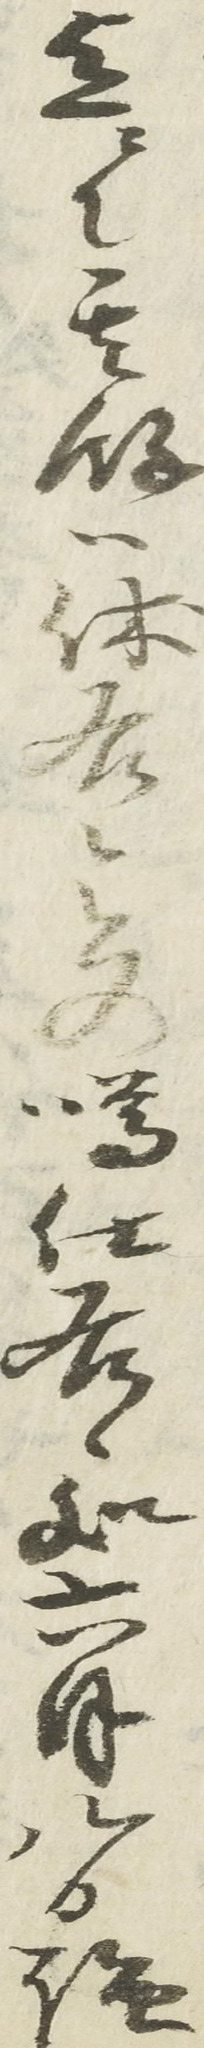迄ニて其余は休居候との噂仕居候処六月八日強
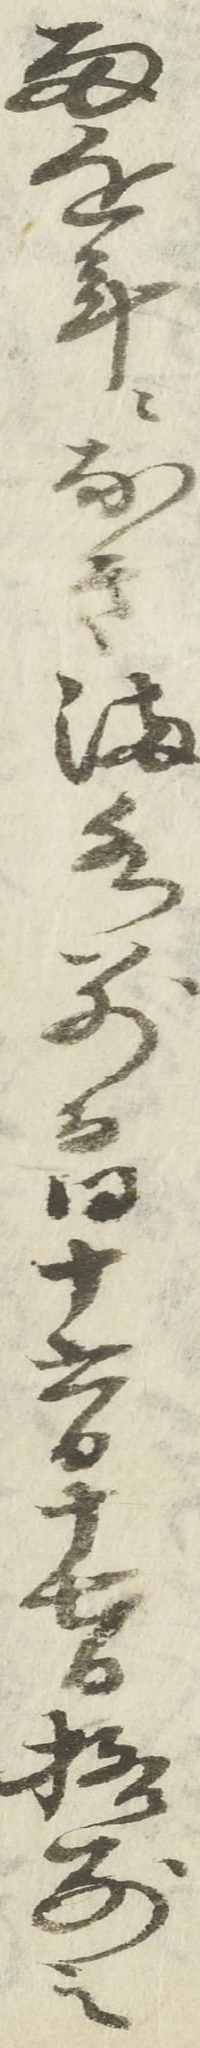雨近年ニなきまた別而同十六日十七日格別之
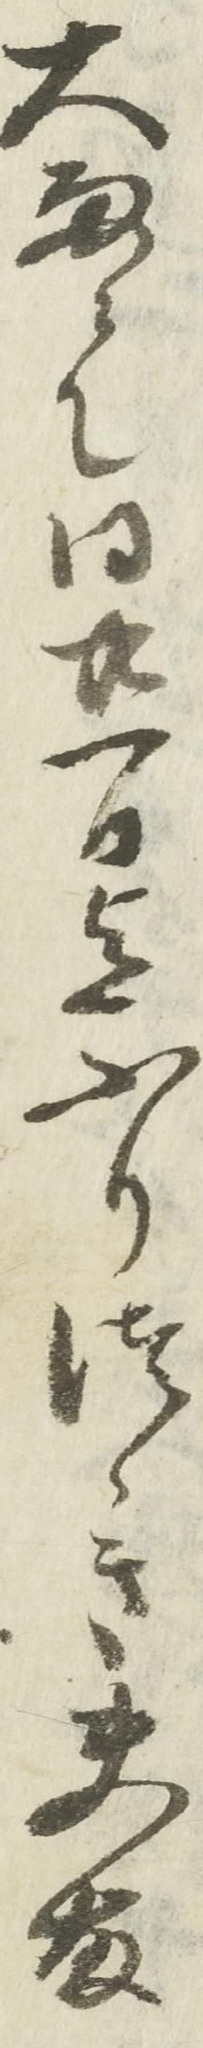大雨ニて同廿一日迄ふりつゝき夫故
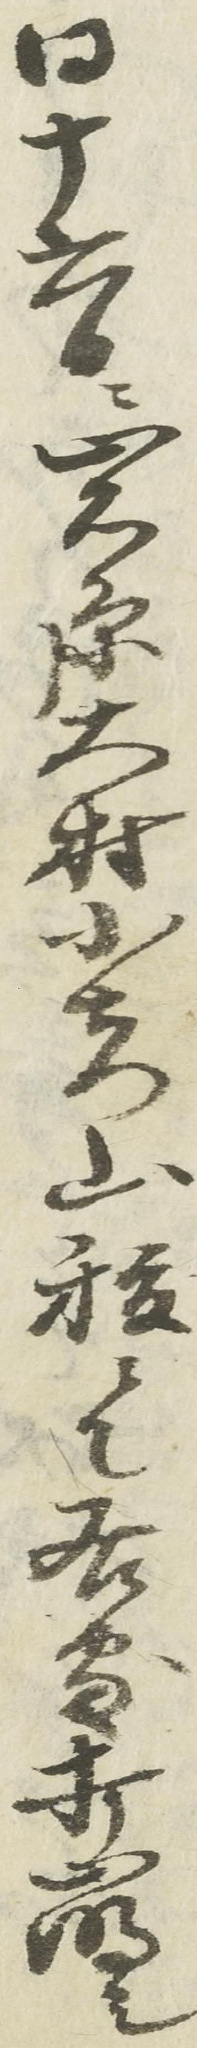同十六日ニ岩原大村小右衛門山稜ニて居家打崩シ
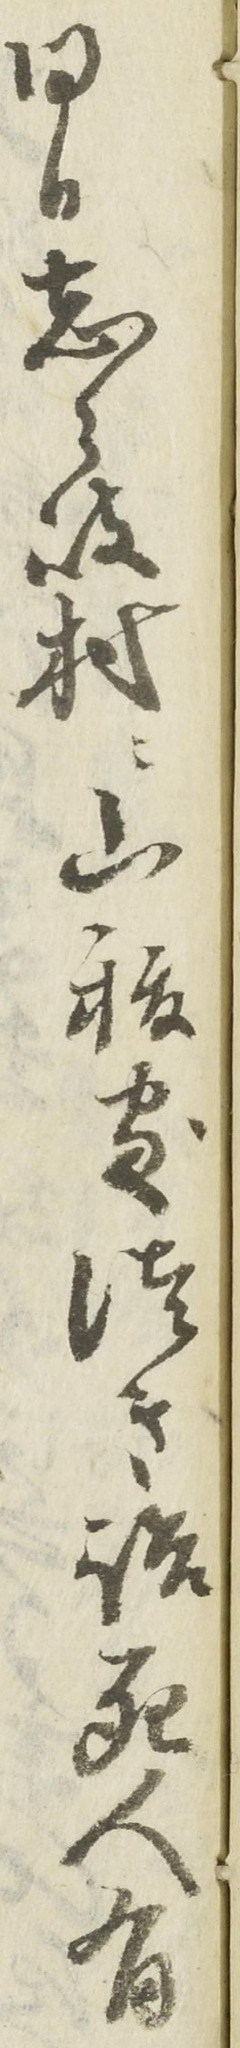同日志〻波村ニ山稜家つき詰死人有
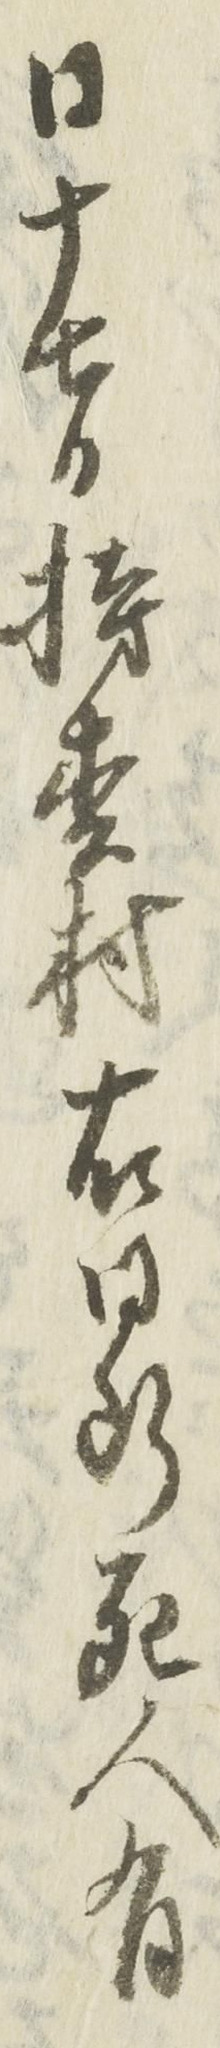同十七日持杢村右同断死人有
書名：後見笑
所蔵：東京大学地震研究所図書室 Earthquake Research Institute Library, The University of Tokyo, JAPAN
